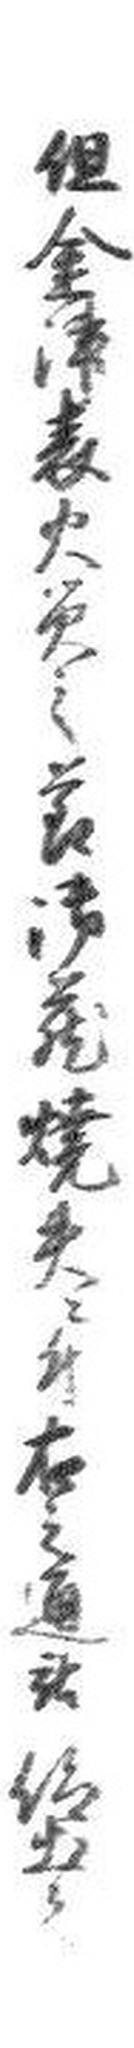但金津表火災之節御蔵焼失ニ付右之通被仰出之
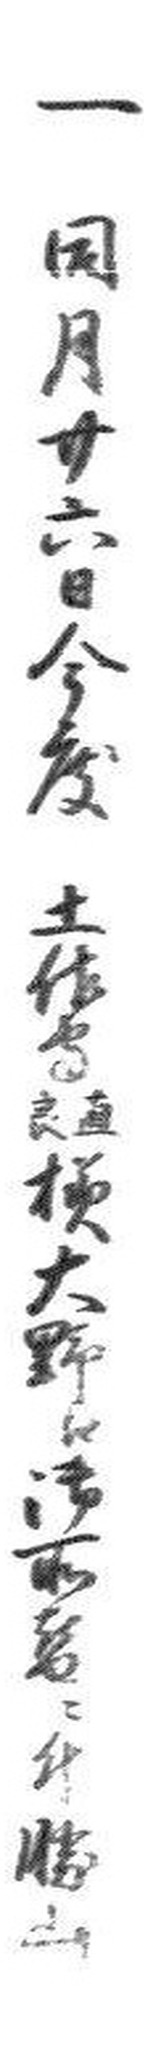一同月廿六日今度土佐守直良様大野江御所替ニ付勝山
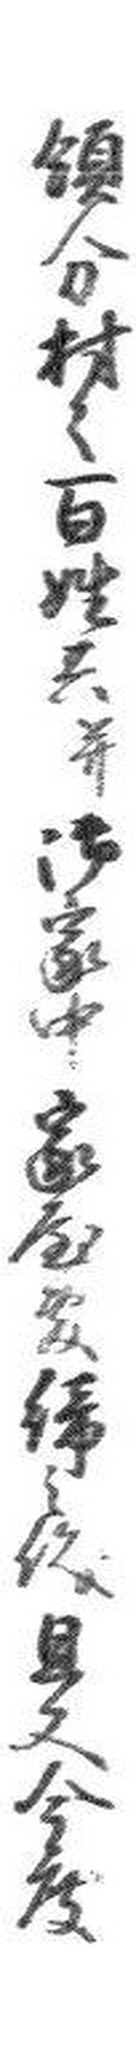領分村々百姓共并御家中家屋敷締之儀且又今度
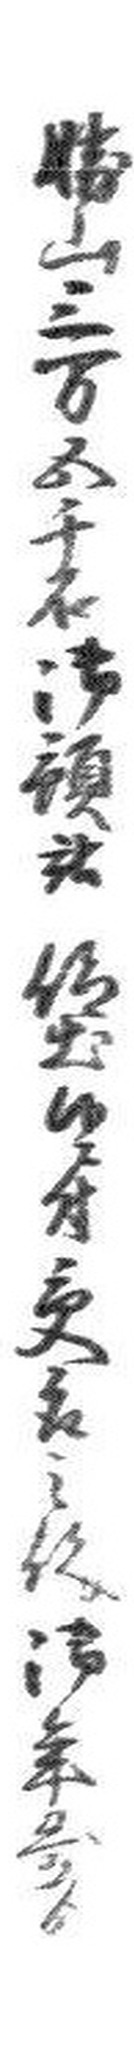勝山三万五千石御預被仰出候ニ付受取之儀御年寄ゟ
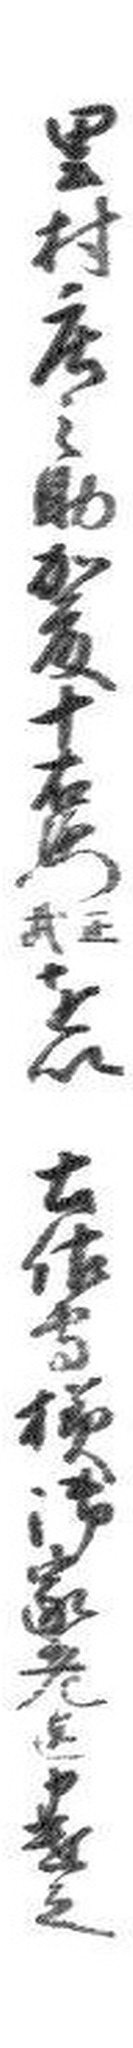里村庄之助加藤十右衛門正武を以土佐守様御家老迄申遣之
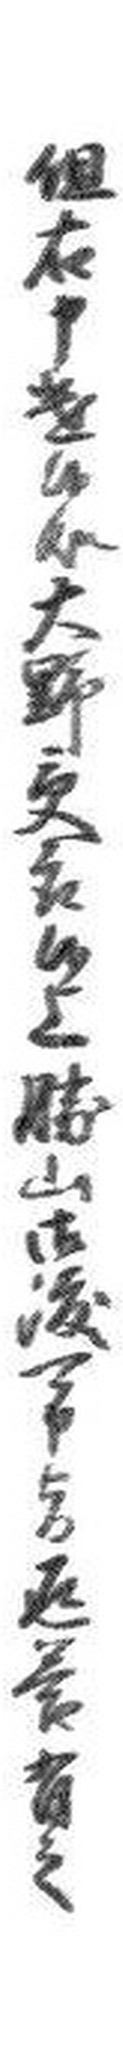但右申遣候処大野受取候上勝山御渡可申旨返答有之

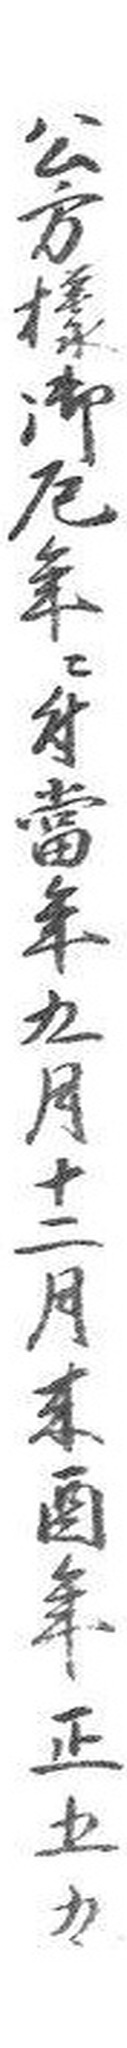公方様御厄年ニ付当年九月十二月来酉年正五九
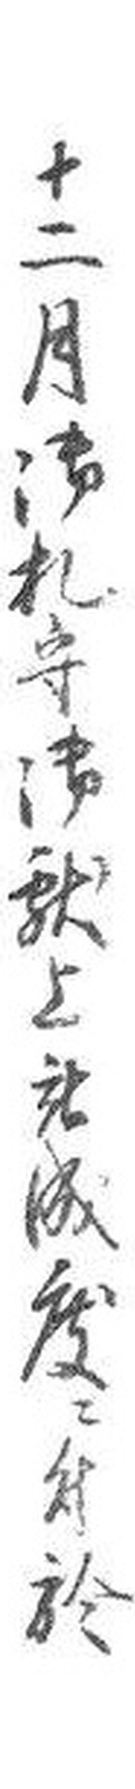十二月御札守御献上被成度ニ付於
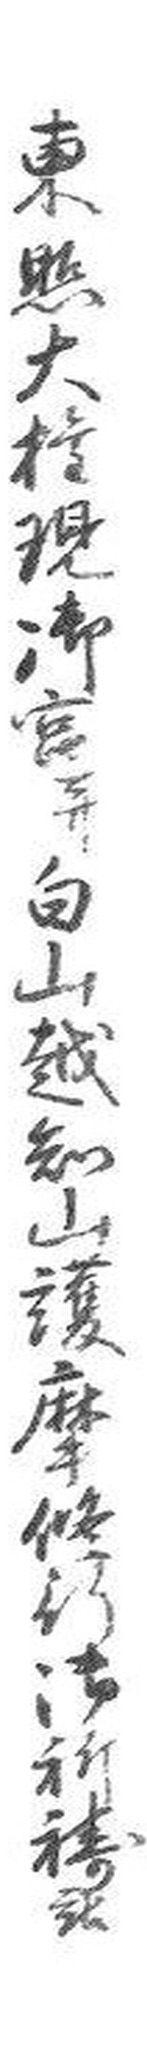東照大権現御宮并白山越知山護摩修行御祈祷被
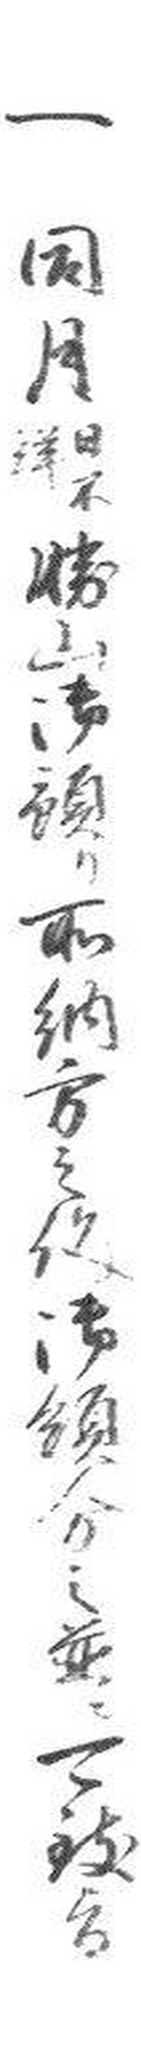一同月日不詳勝山御預リ所納方之儀御領分之並ニ可致旨
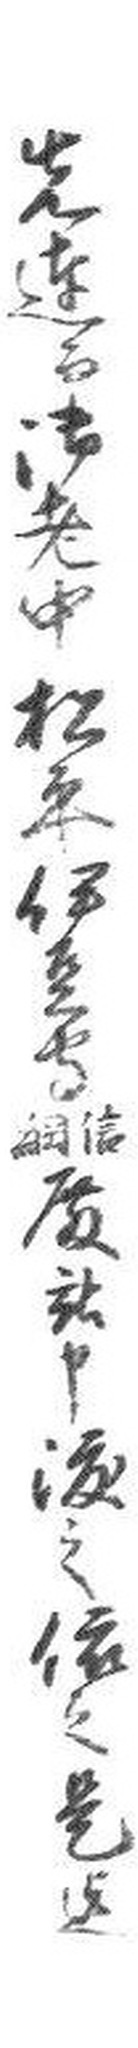先達而御老中松平伊豆守信綱殿被申渡之依之是迄
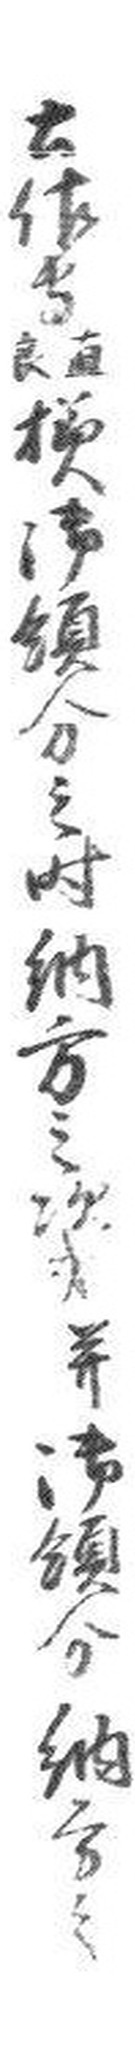土佐守直良様御領分之時納方之次第并御領分納方之
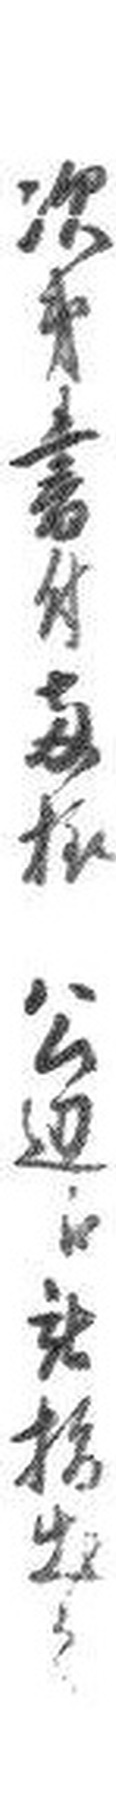次第書付両様公辺江指出之
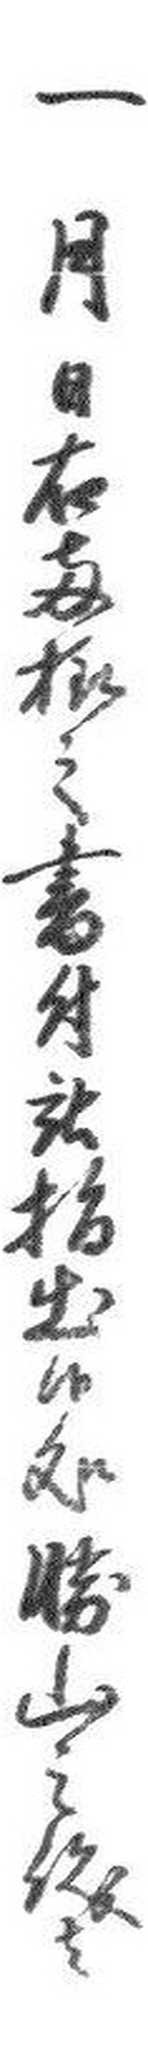一月日右両様之書付被指出候処勝山之儀者
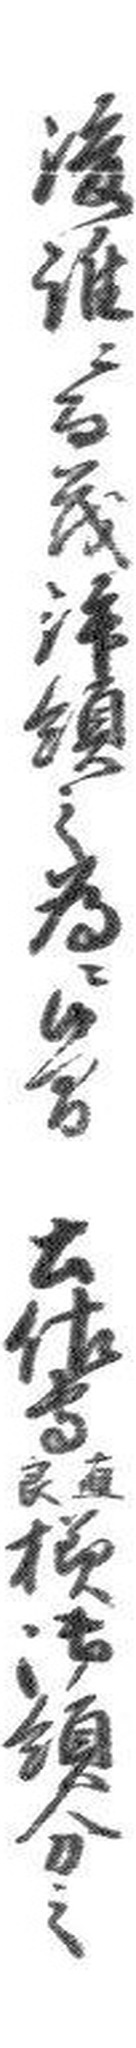後誰ニ而茂拝領之為ニ候間土佐守直良様御領分之
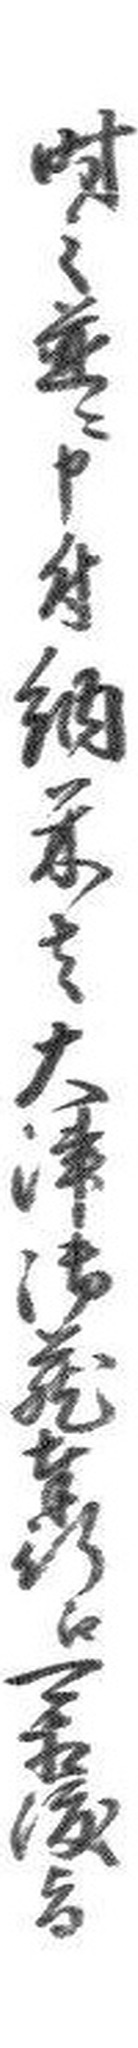時之並ニ申付納米者大津御蔵奉行江可相渡旨
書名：家譜 四 忠昌公 従寛永七年到正保四年
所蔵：福井県文書館 Fukui Prefectural Archives
